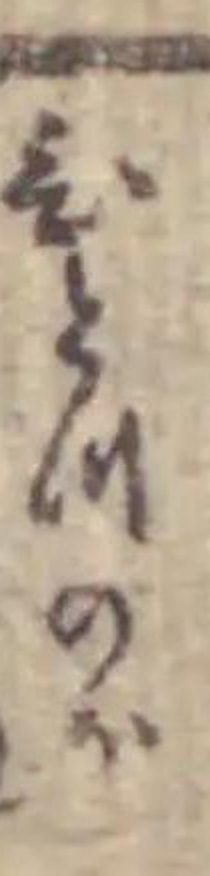ひとつのが
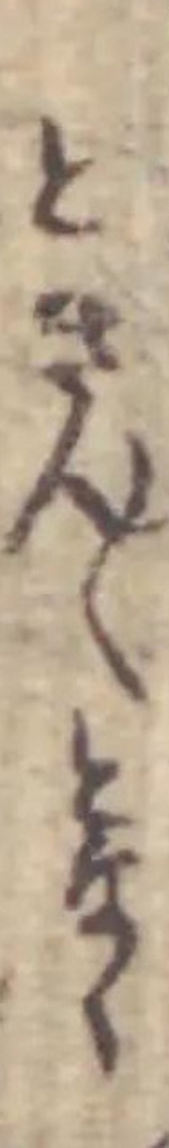ときん〳〵となく
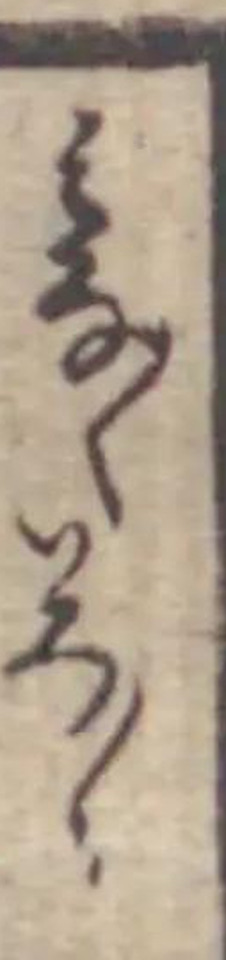みな〳〵いろ〳〵
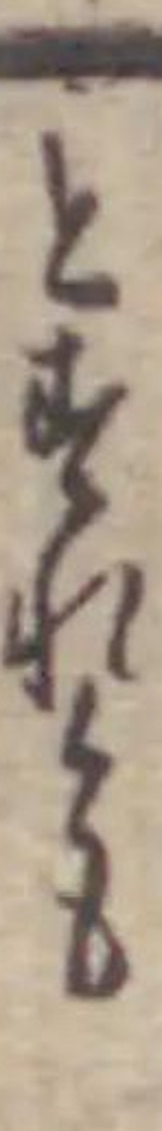とすれとも
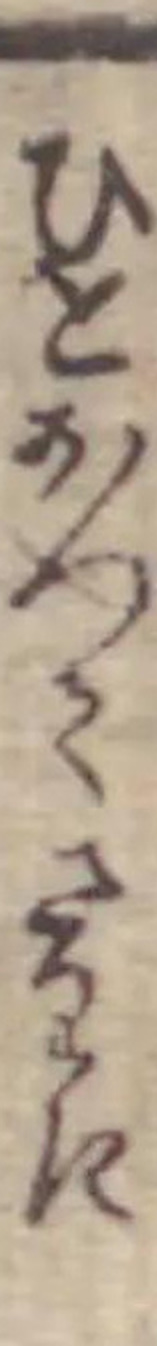ひをおつてさわに
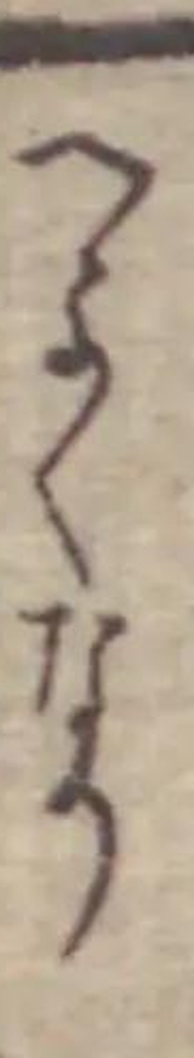つよくなり
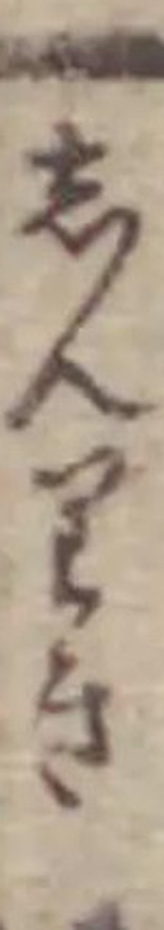しんりき
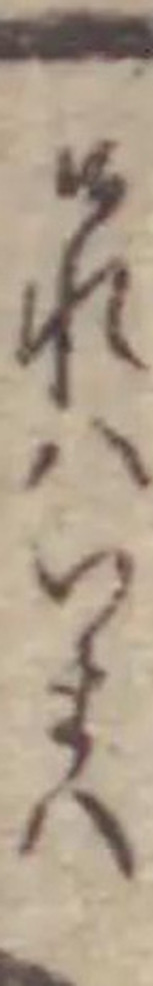けれはいまは
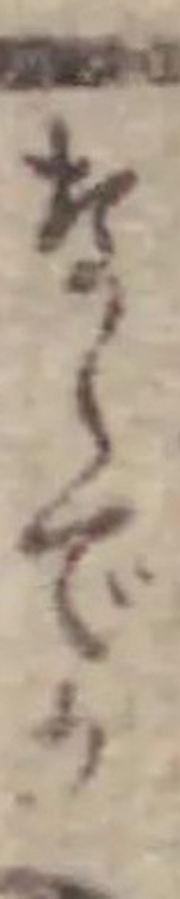ならでか
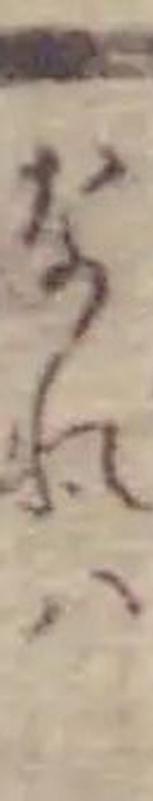なれは
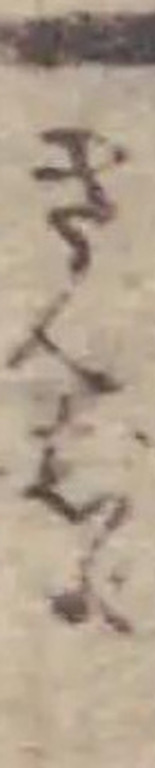きんじよ
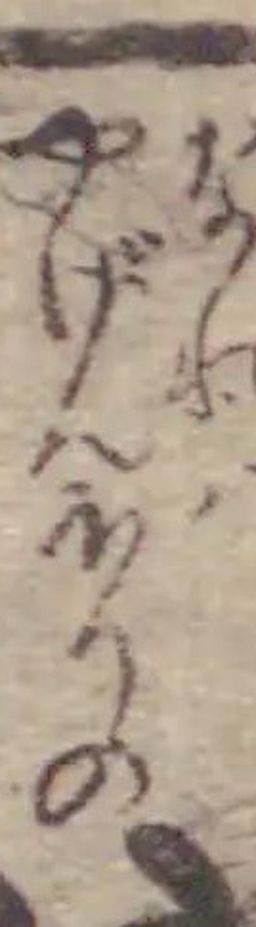やげんほりの
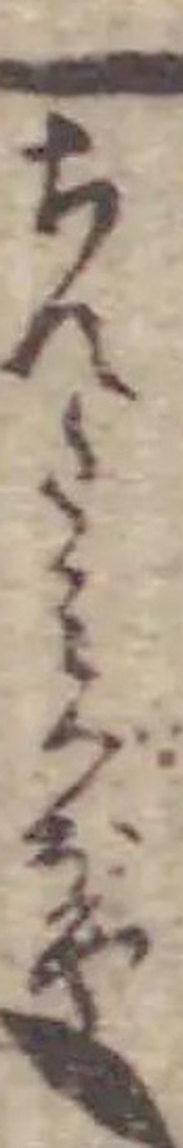ちんたみがおや
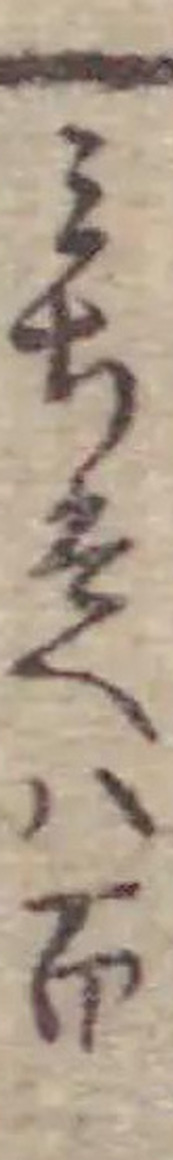みち兵へは百
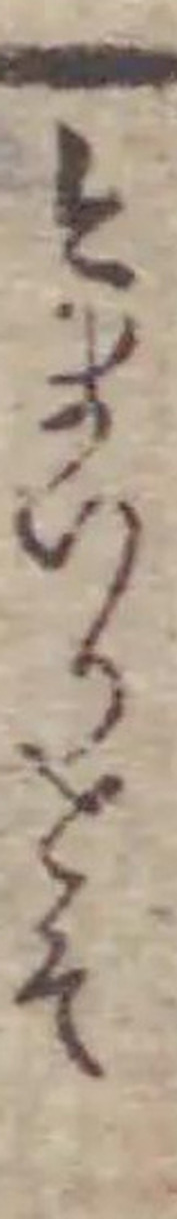とまいりをそ
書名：通人為真似 2巻
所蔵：国立国会図書館 National Diet Library, JAPAN
